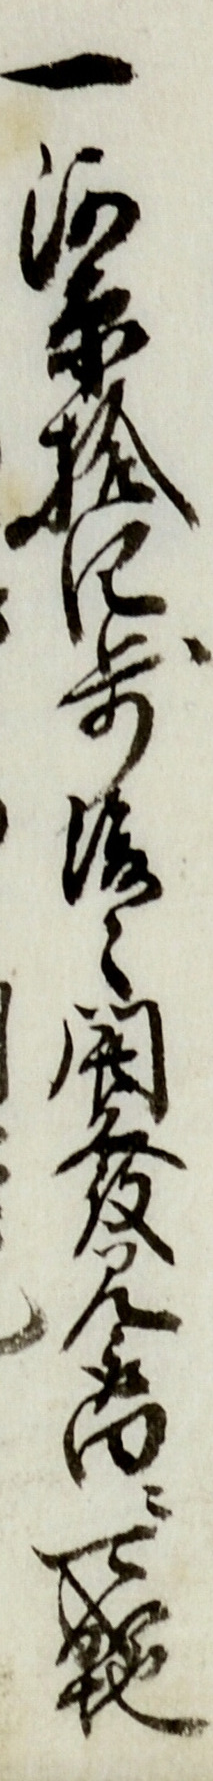一河原拾四歩後々開発見取田ニ可成地
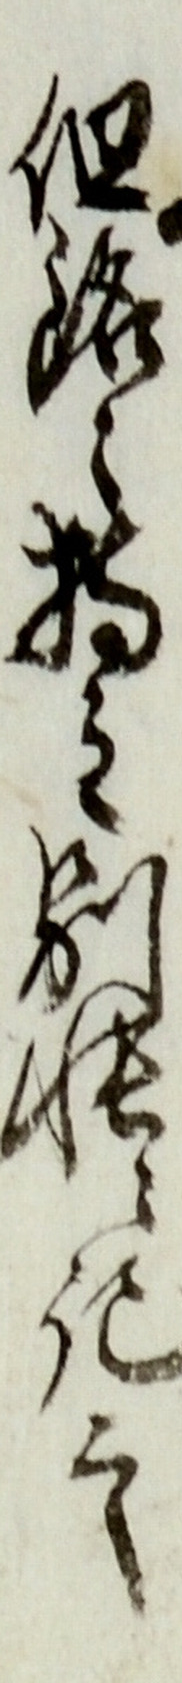但銘々持主別帳ニ記之
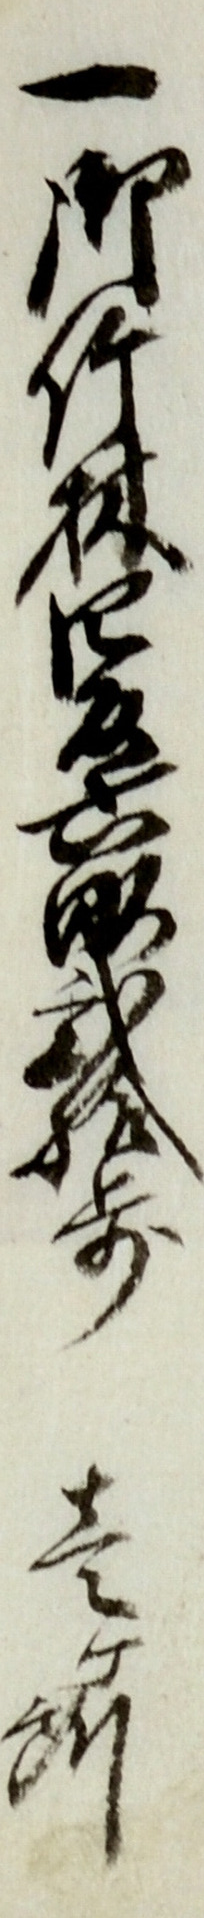一御竹林四反六畝弐拾歩壱ヶ所

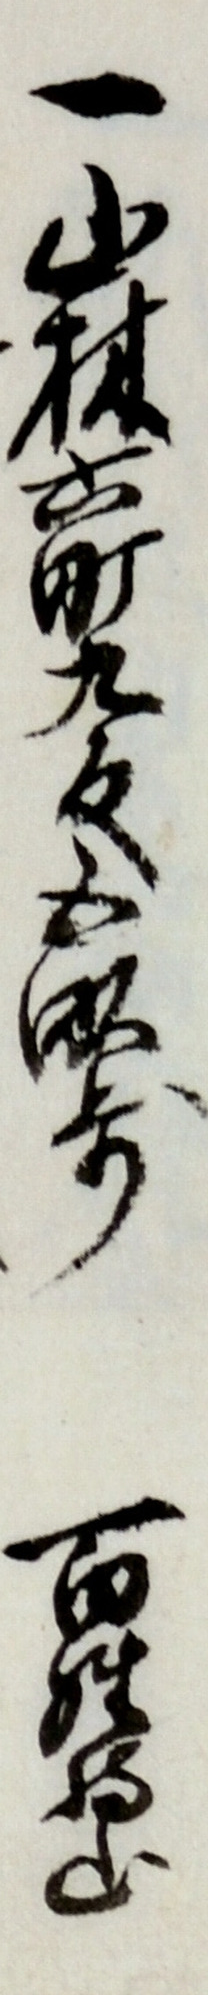一山林六町九反五畝歩百姓持山
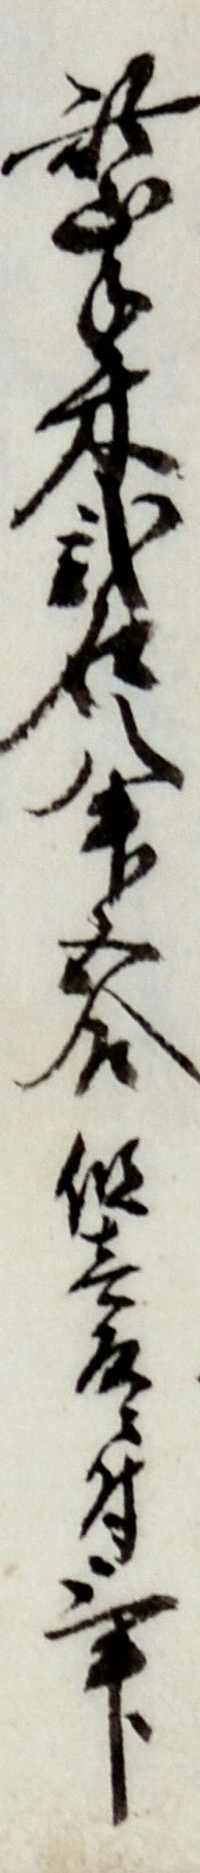此山手米弐石八升五合但壱反ニ付三升
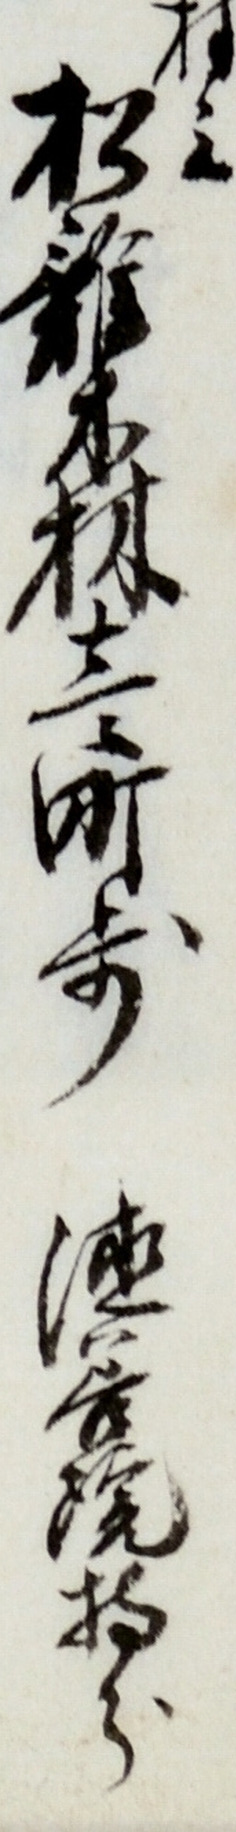松雑木林壱町歩徳善院持分
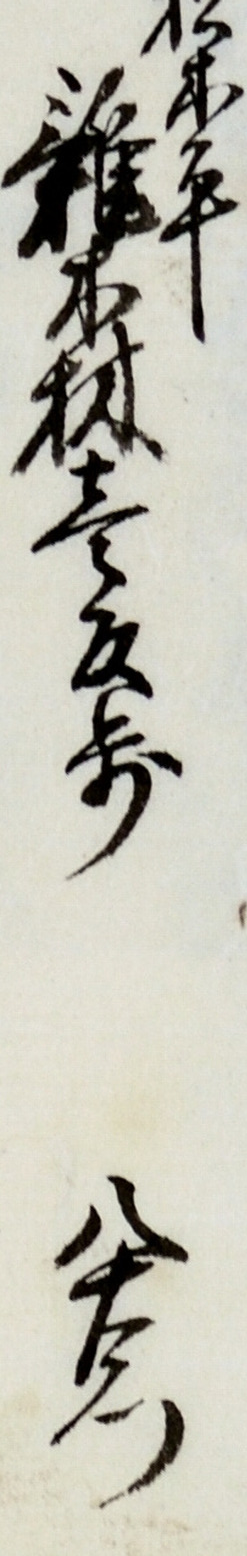雑木林壱反歩八右衛門
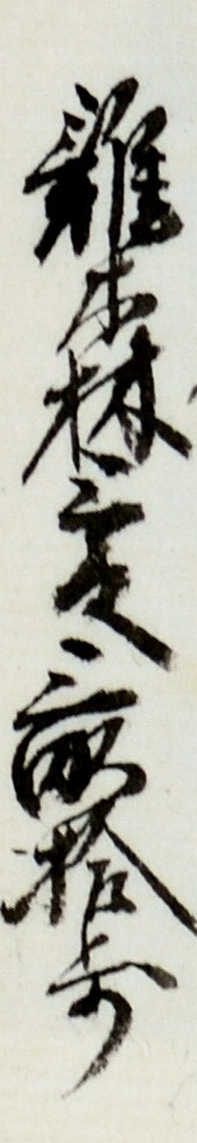雑木林三反三畝拾歩村中
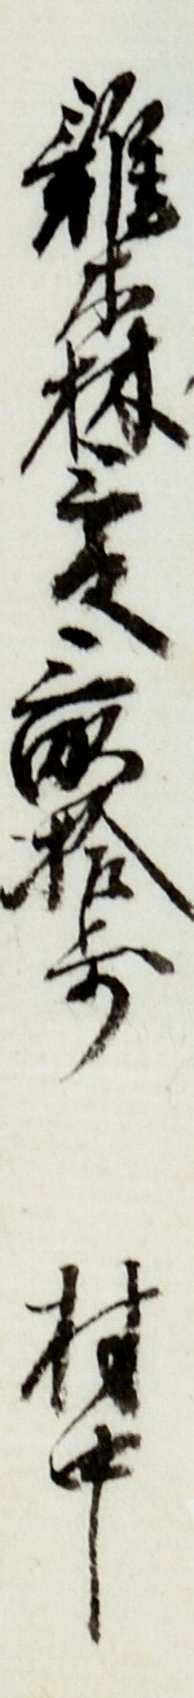雑木林三反三畝拾歩村中
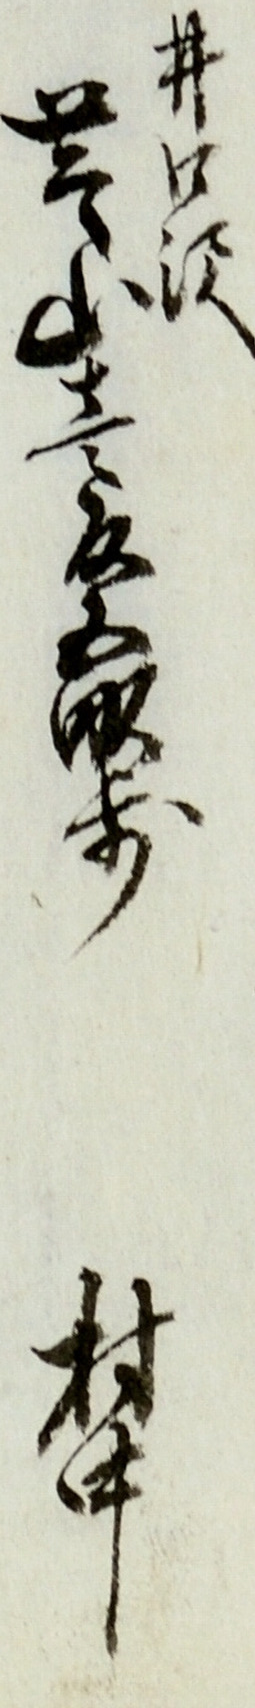芝山壱反五畝歩村中
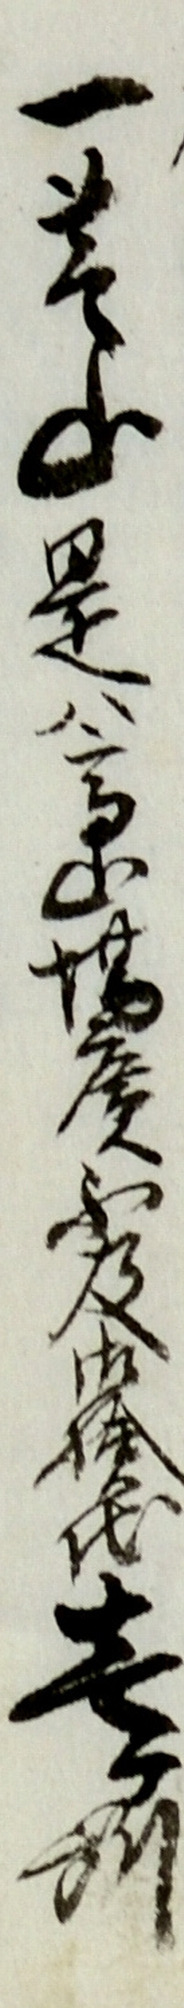一芝山是ハ高山場広不及御検地壱ヶ所

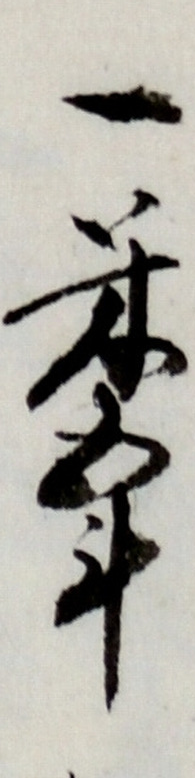一米五斗
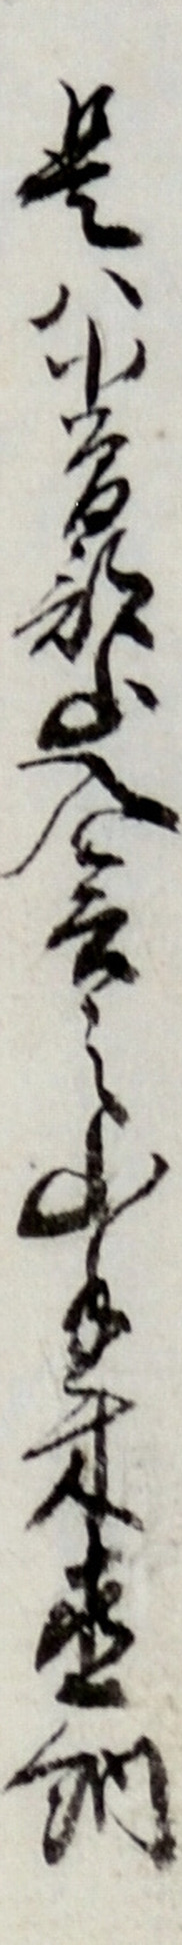是ハ小曾部山入会之山手米直納
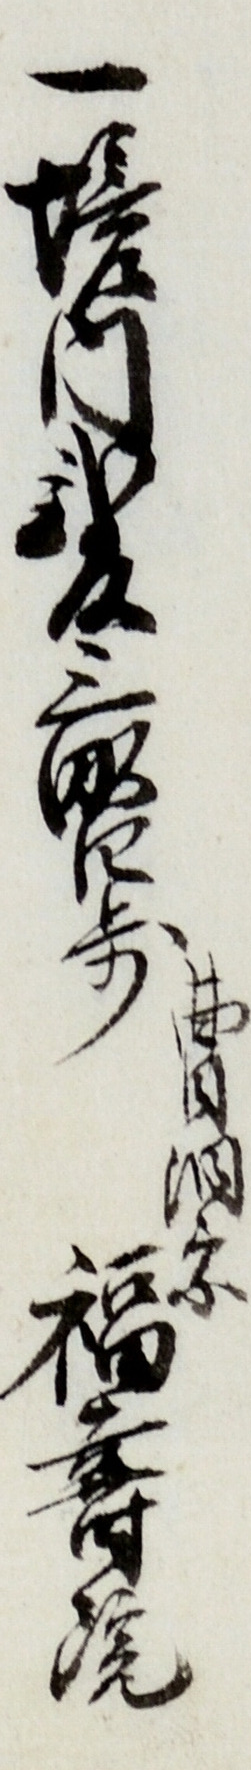一境内弐反三畝四歩福寿院
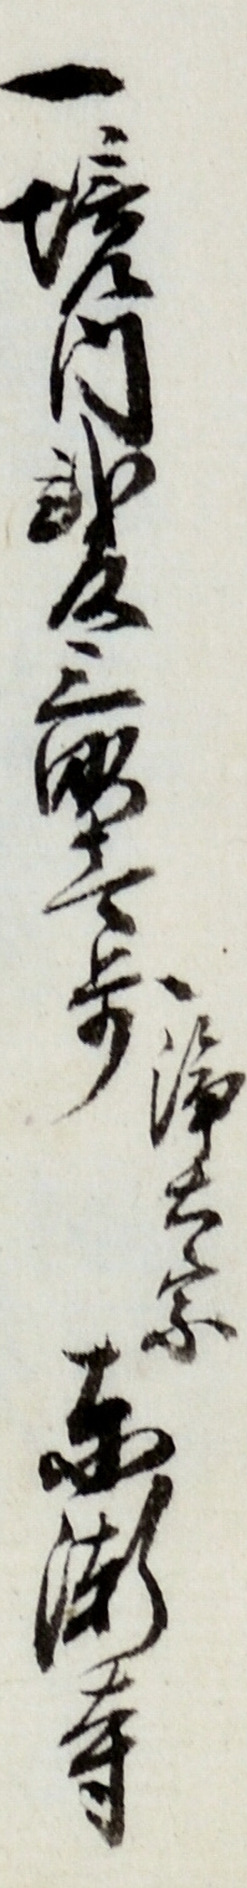一境内弐反三畝壱歩東漸寺
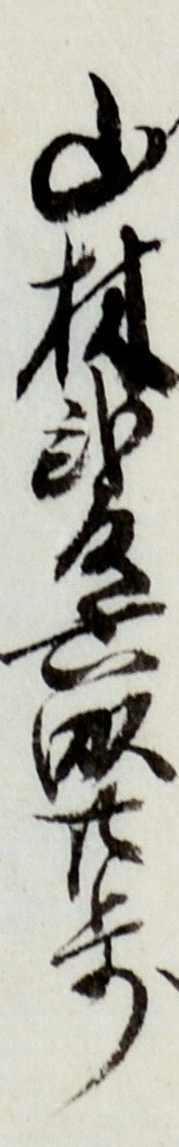山林弐反六畝廿歩同寺
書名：御領分中山林社地手控
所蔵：伊那市立高遠町図書館・合同会社AMANE
